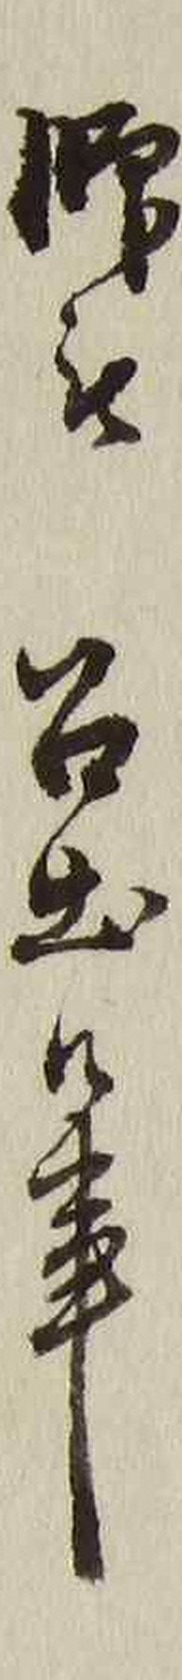師被召出事口
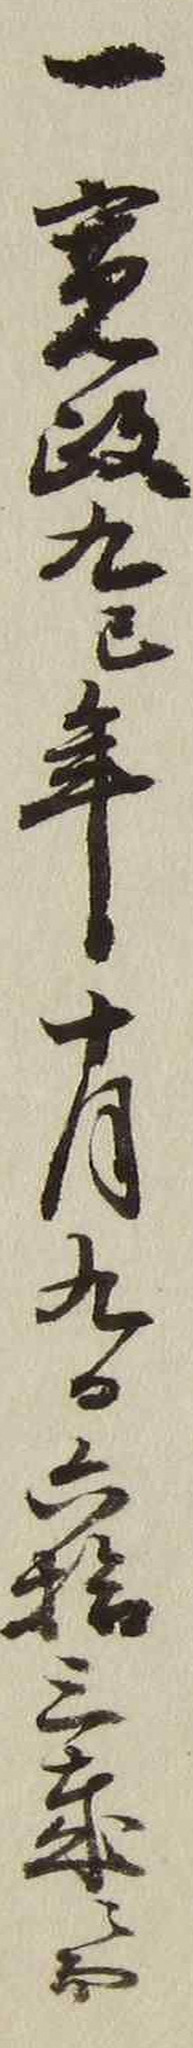一寛政九巳年十月九日六拾三歳ニ而
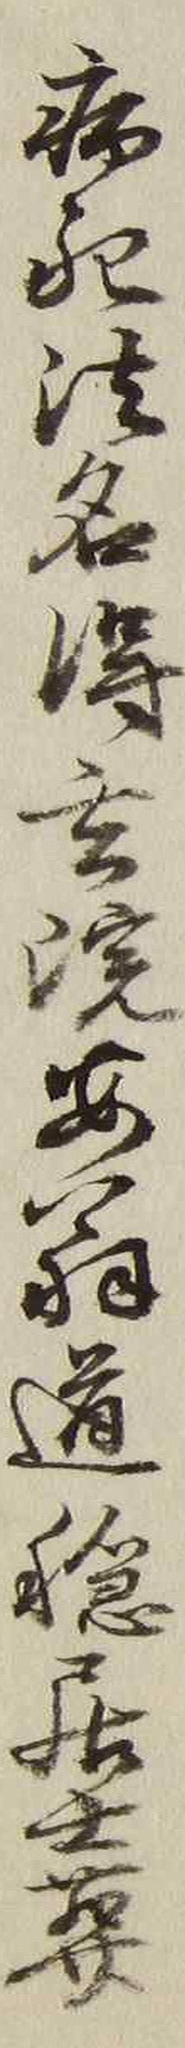病死法名得玄院安翁道穏居士葬

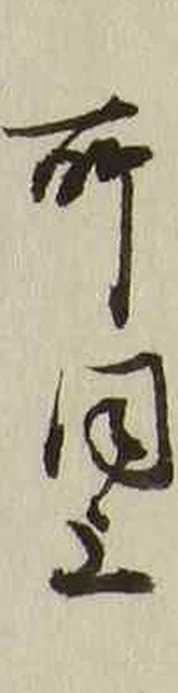所同上
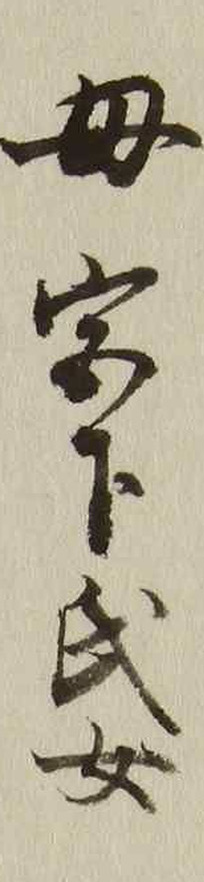母宮下氏女
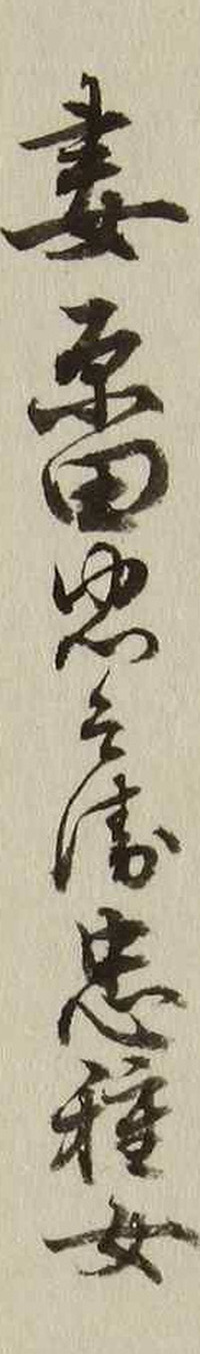妻原田忠兵衛忠種女
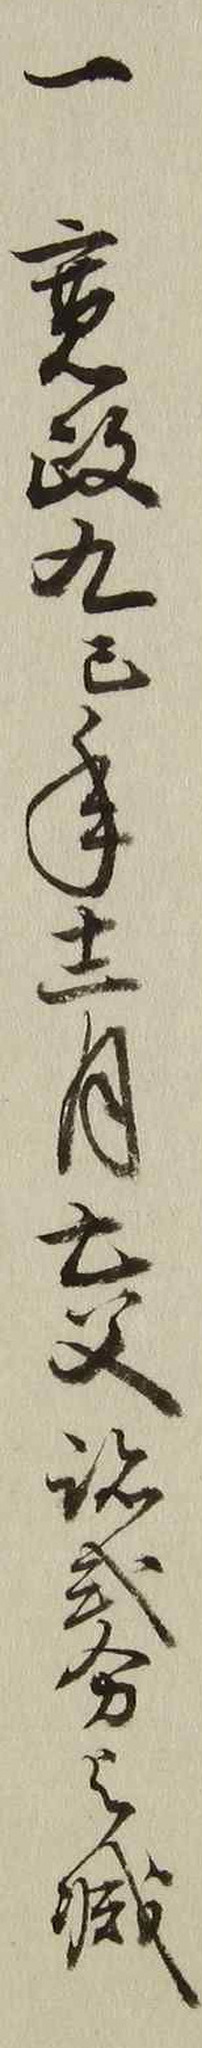一寛政九巳年十二月亡父跡弐分与減
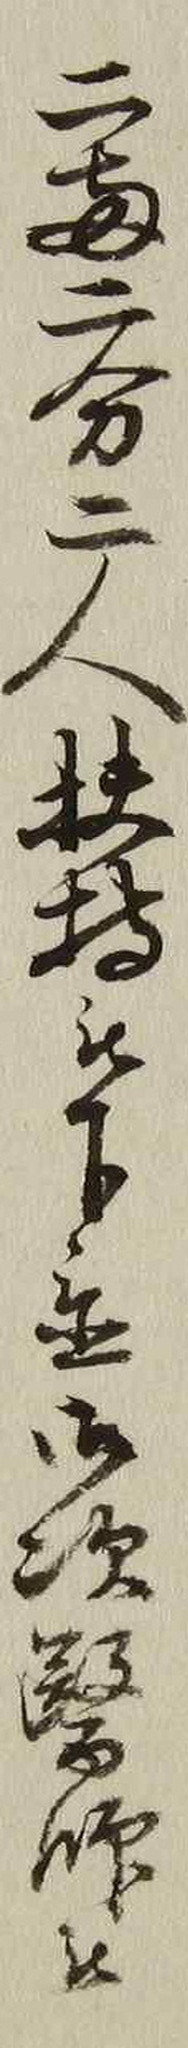二両二分二人扶持被下置御次医師被
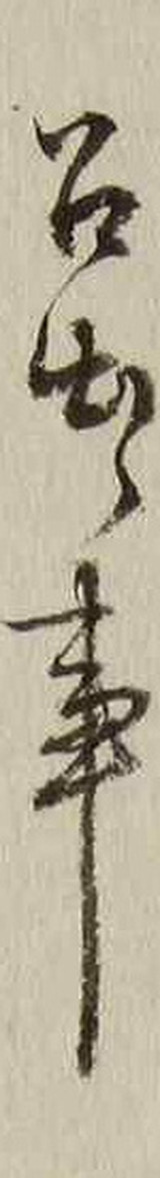召出候事
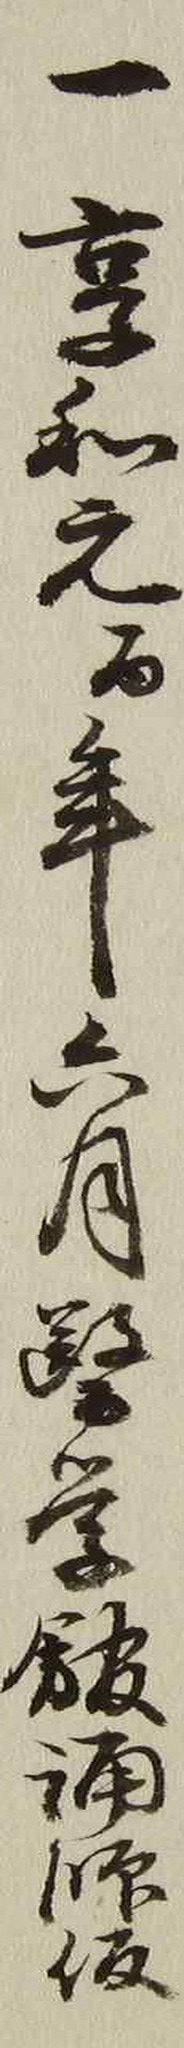一享和元酉年六月医学館誦師仮
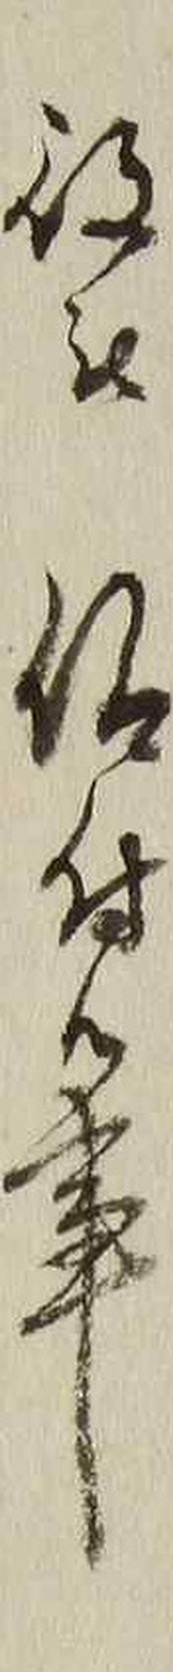役被仰付候事
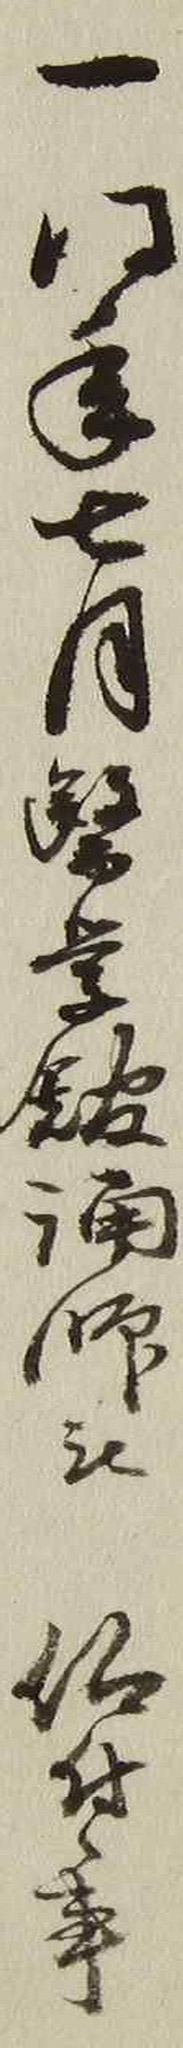一同年七月医学館誦師被仰付候事
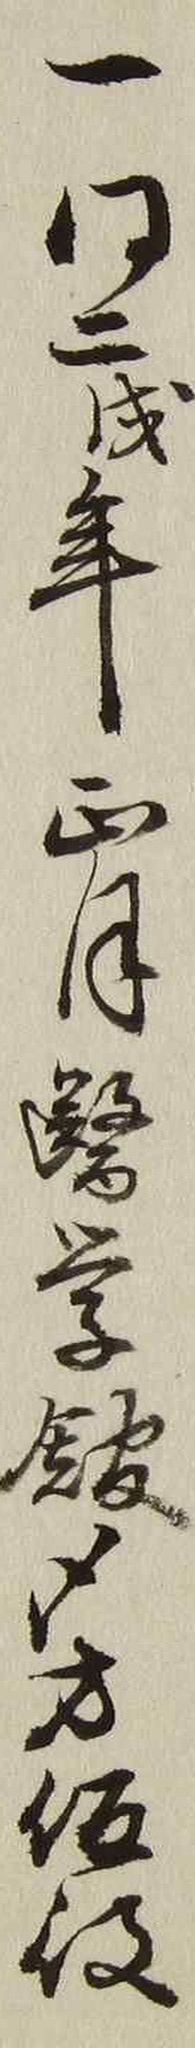一同二戌年正月医学館〆方仮役
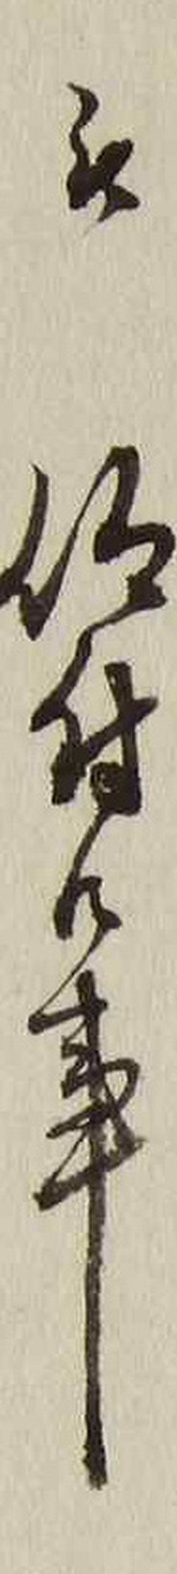被仰付候事
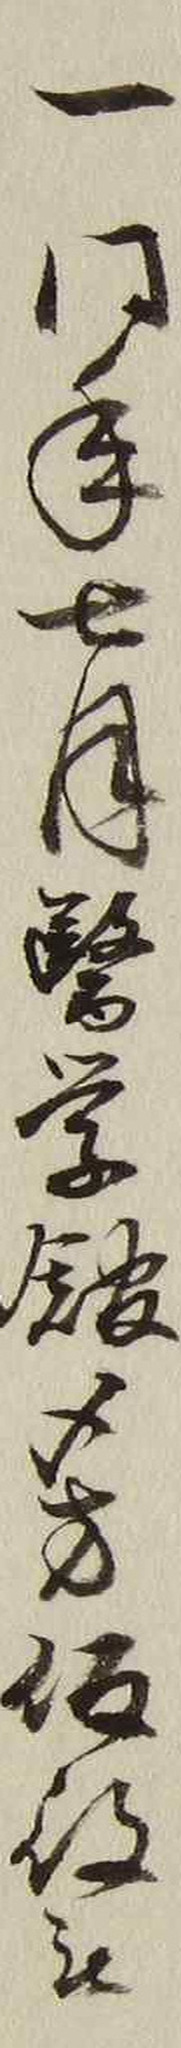一同年七月医学館〆方仮役被
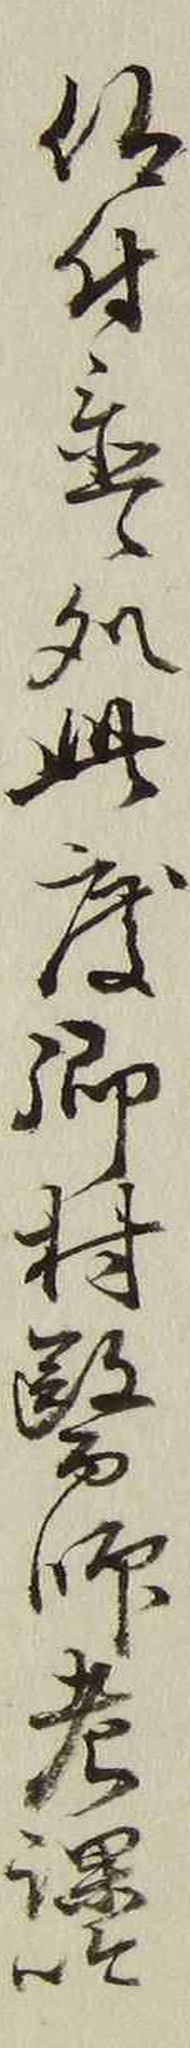仰付置候処此度郷村医師考課吟
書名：諸士系譜　巻之39　は之部7
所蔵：会津若松市立会津図書館
